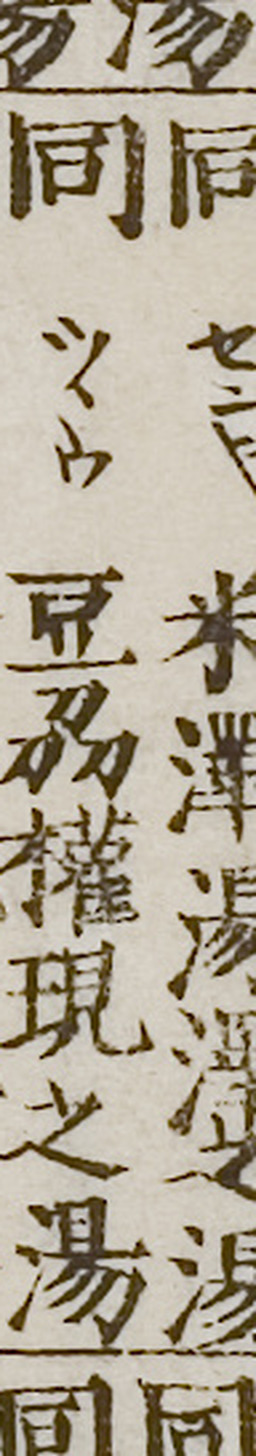同ツヽウ豆州権現之湯
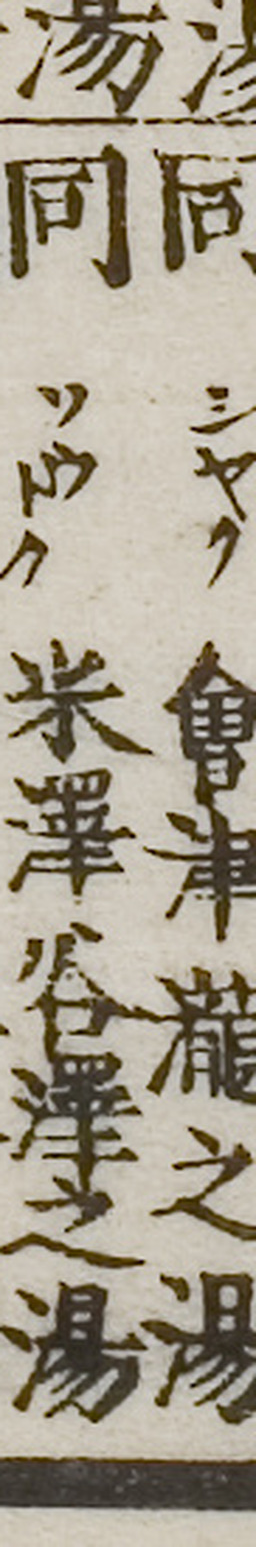同ソウトク米沢谷沢之湯
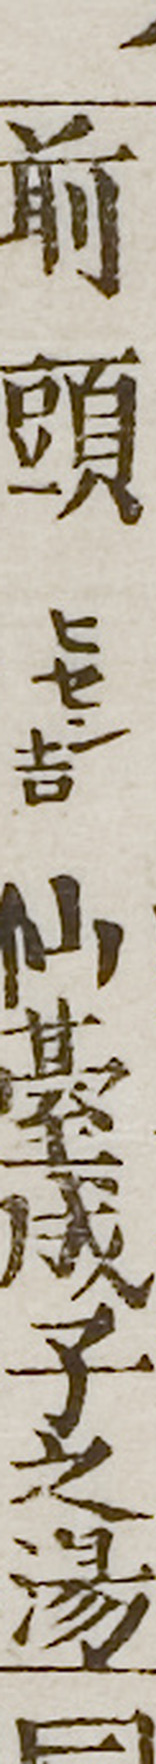前頭ヒセン吉仙台成子之湯
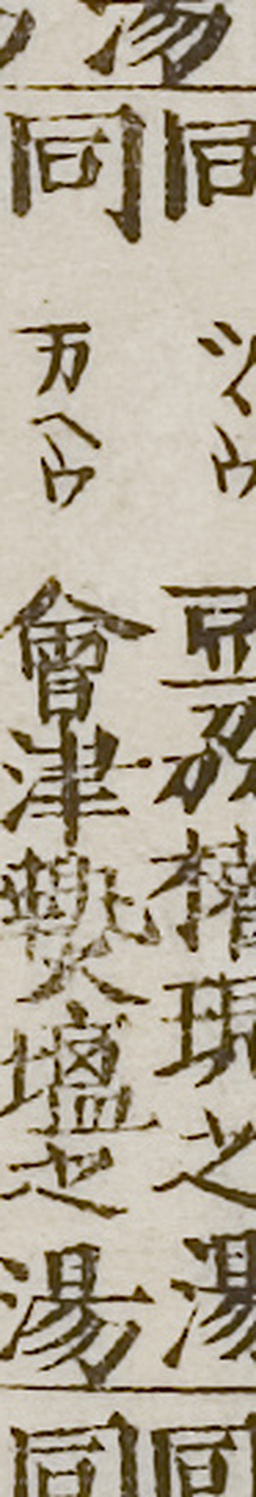同万ヘウ会津熱塩之湯
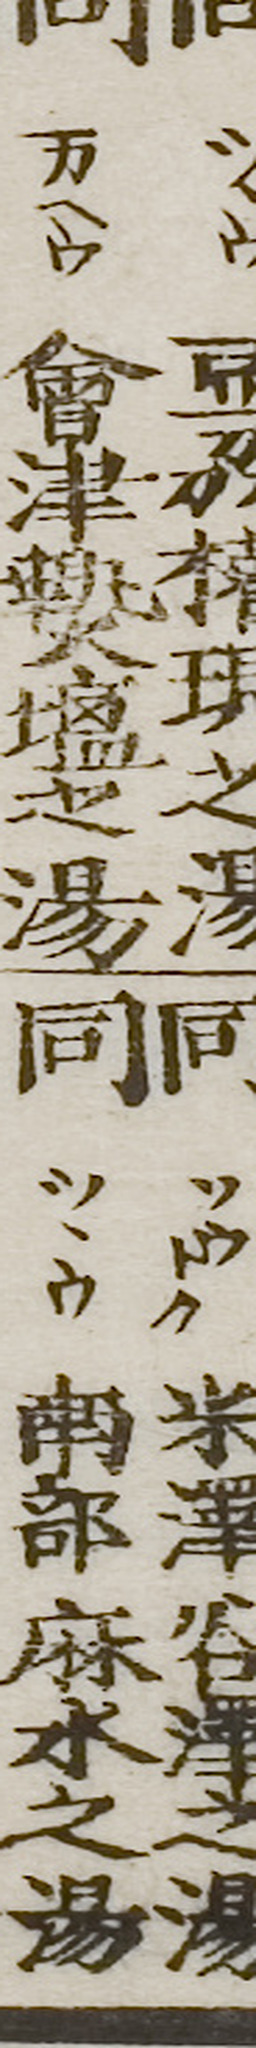同万ヘウ会津熱塩之湯
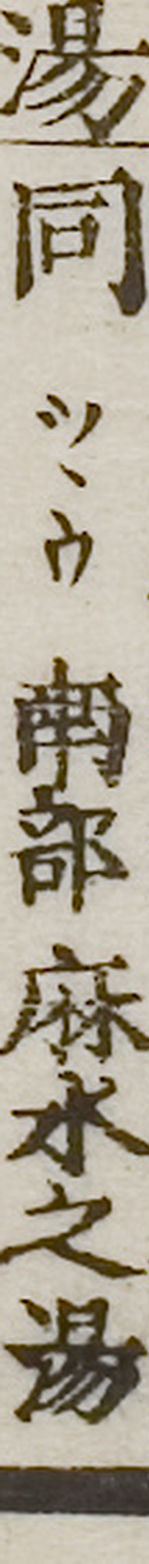同ツヽウ南部麻水之湯
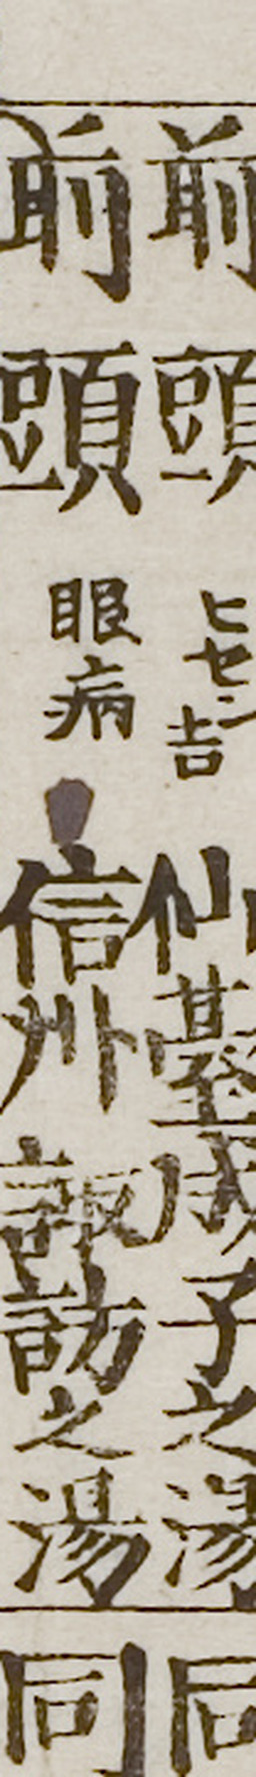前頭眼病信州諏訪之湯
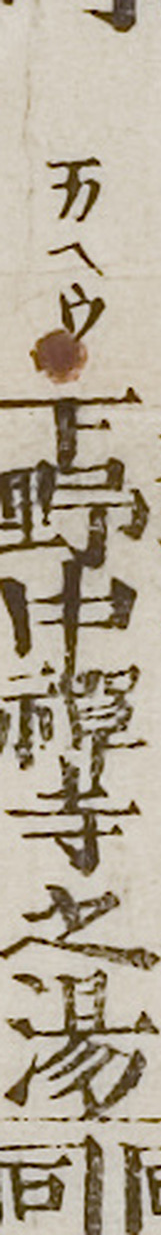同万ヘウ下野中禅寺之湯
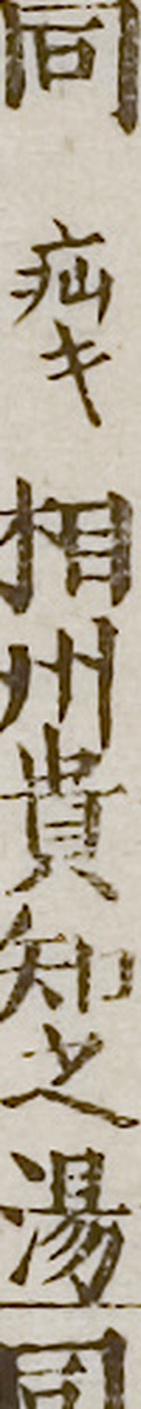同疝キ相州貴知之湯
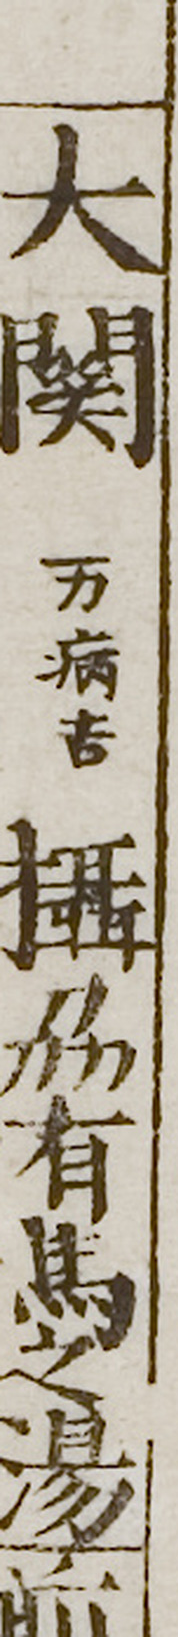大関万病吉摂州有馬之湯
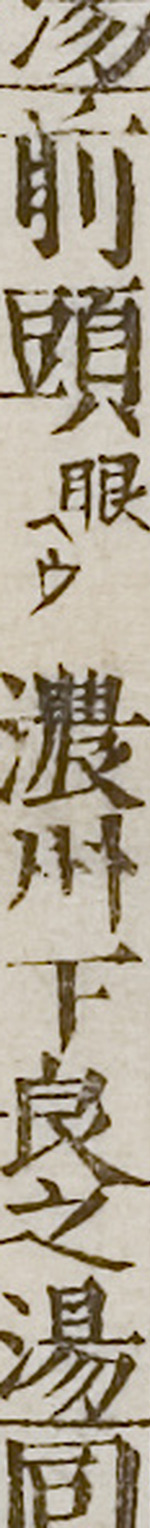前頭眼ヘウ濃州下良之湯
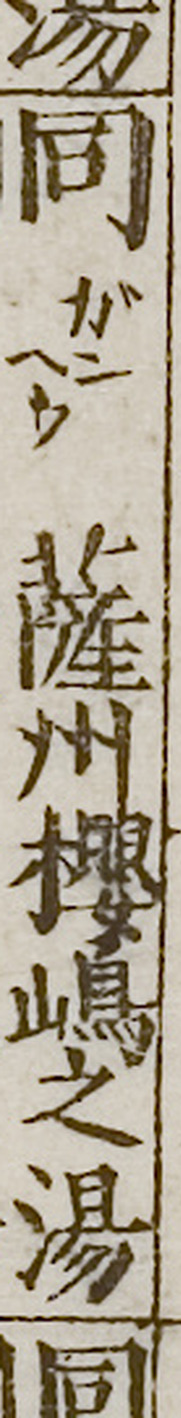同ガンヘウ薩州桜嶋之湯
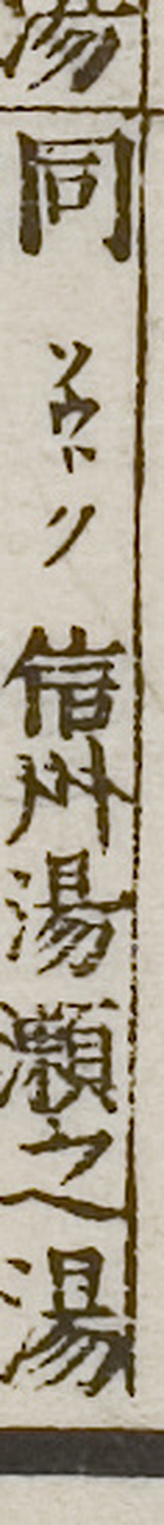同ソウトク信州湯瀬之湯
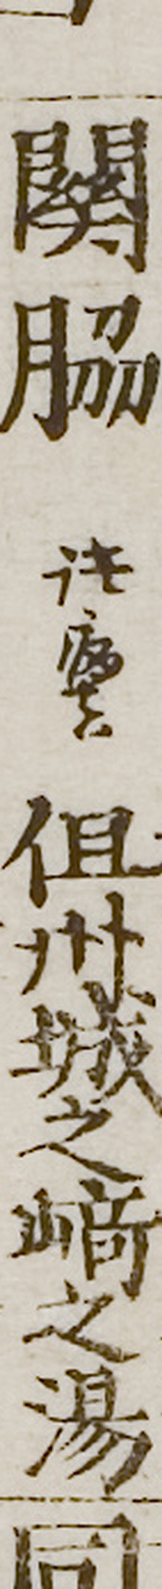関脇諸病吉但州城之崎之湯
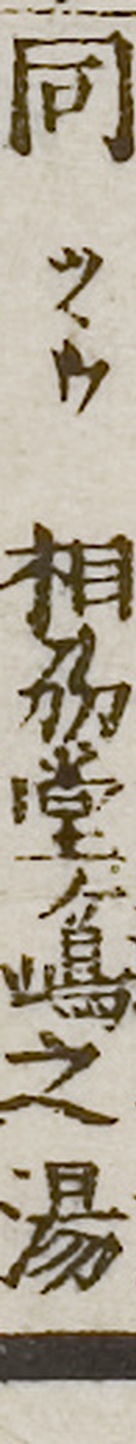同ツヽウ相州堂ヶ嶋之湯
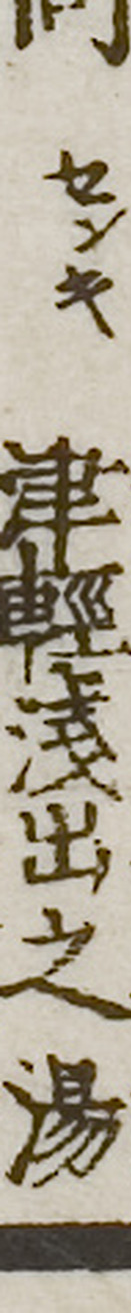同センキ津軽浅出之湯
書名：諸国温泉一覧
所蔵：東京大学総合図書館 General Library in the University of Tokyo, JAPAN
